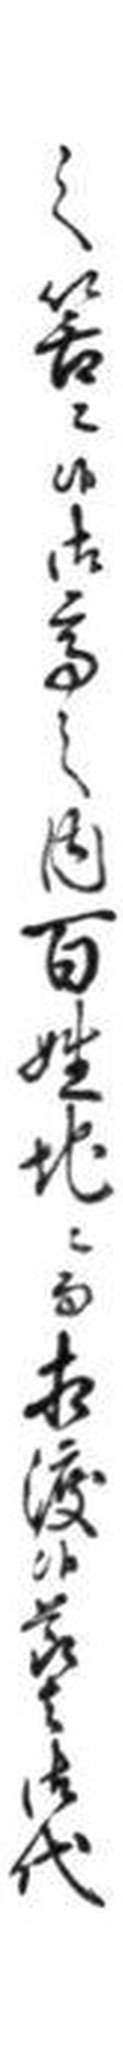之筈ニ候御高之内百姓地ニ而相渡候節者御代
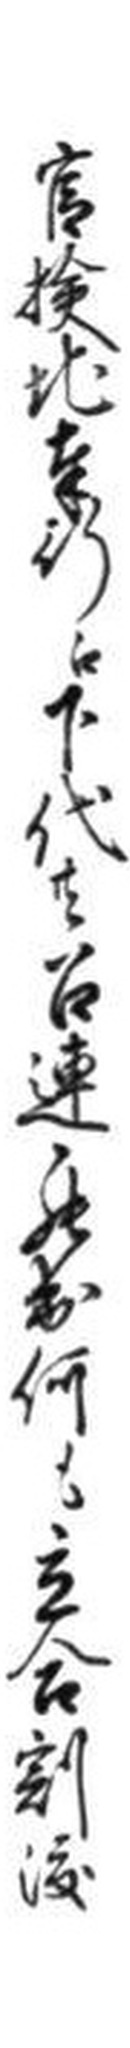官検地奉行江下代共召連罷出何も立合割渡
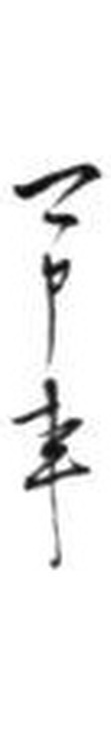可申候
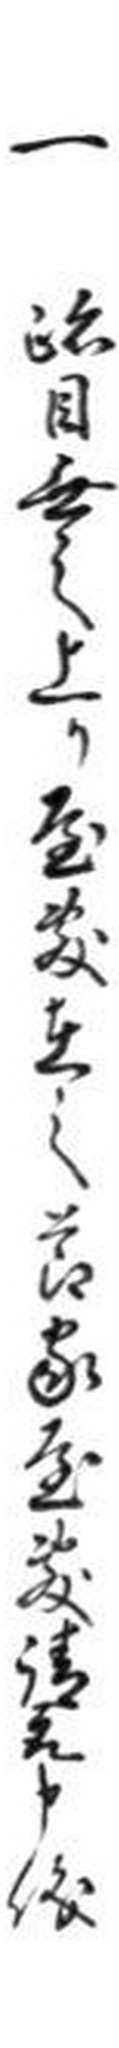一跡目無之上り屋敷在之節家屋敷請取申儀
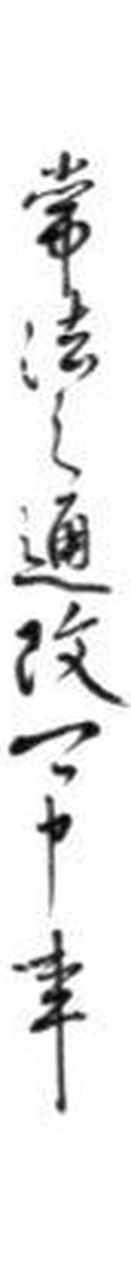常法之通改可申事
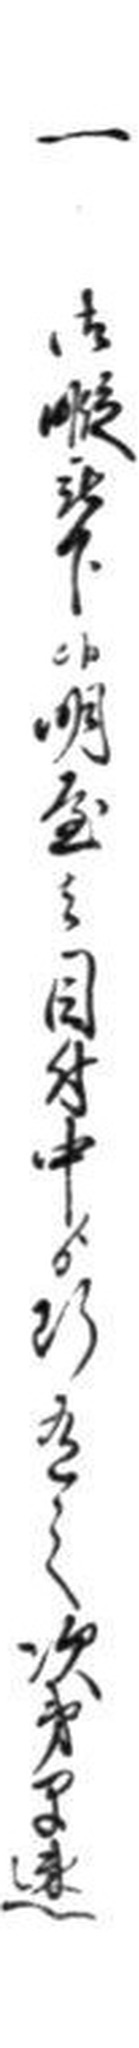一御暇被下候明屋者目付中ゟ断有之次第早速
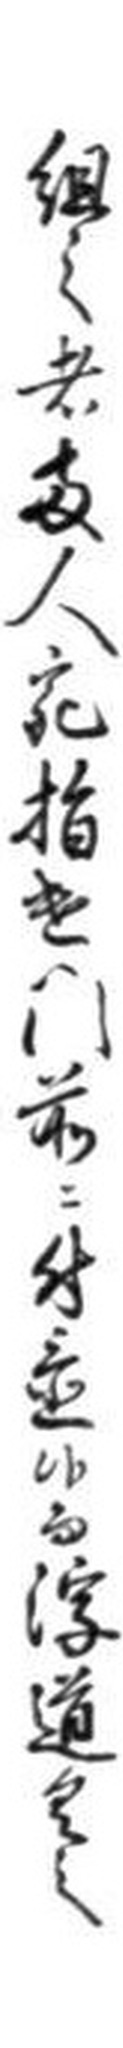組之者両人宛指遣門前ニ付置候而浮道具之
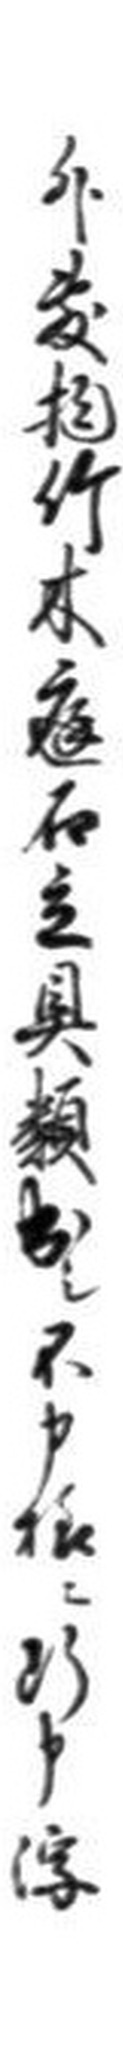外敷物竹木庭石建具類出シ不申様ニ断申浮
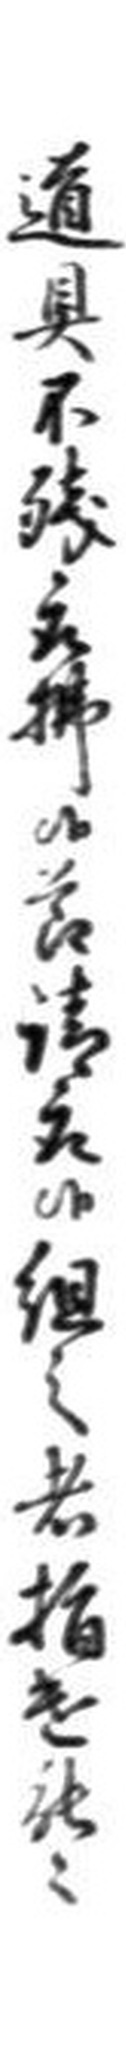道具不残取払候節請取候組之者指遣能々
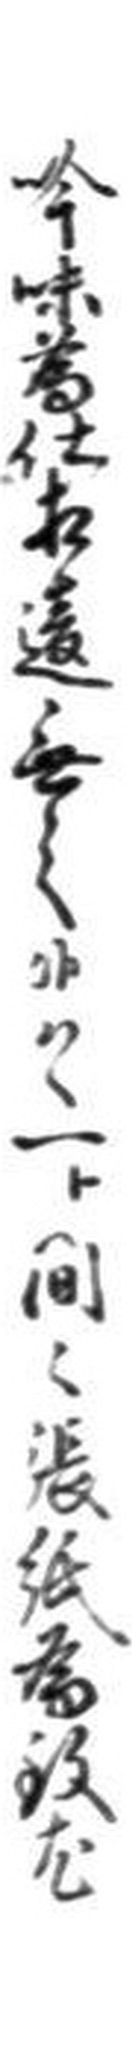吟味為仕相違無之候ハヽ一ト間々張紙為致尤
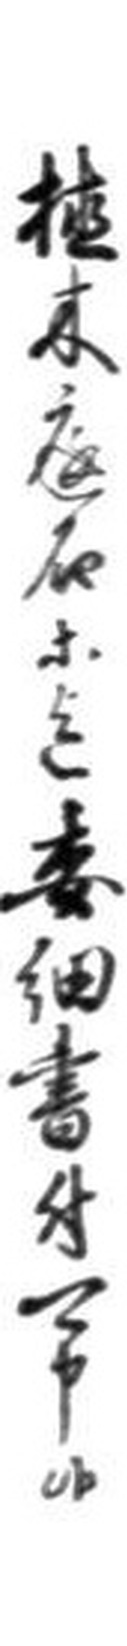植木庭石等迄委細書付可申候
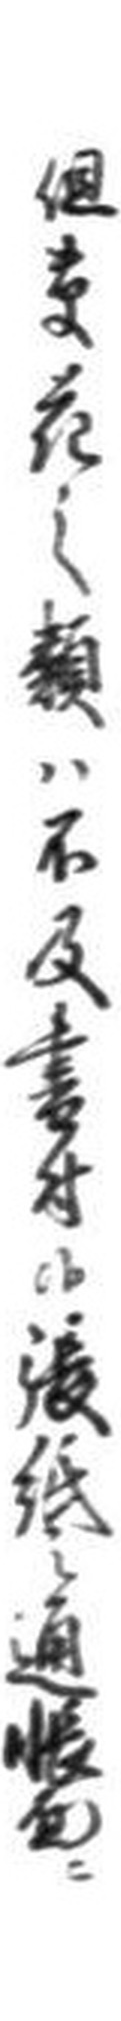但草花之類ハ不及書付候張紙之通帳面ニ
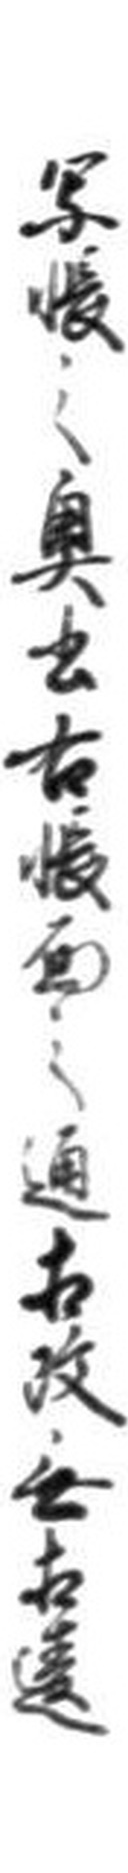写帳之奥書右帳面之通相改無相違
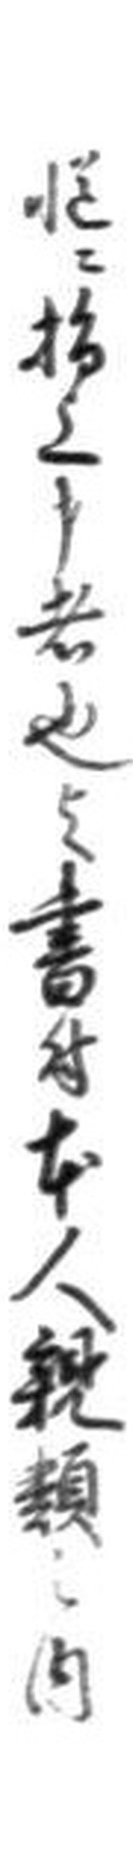慥ニ指上申者也与書付本人親類之内
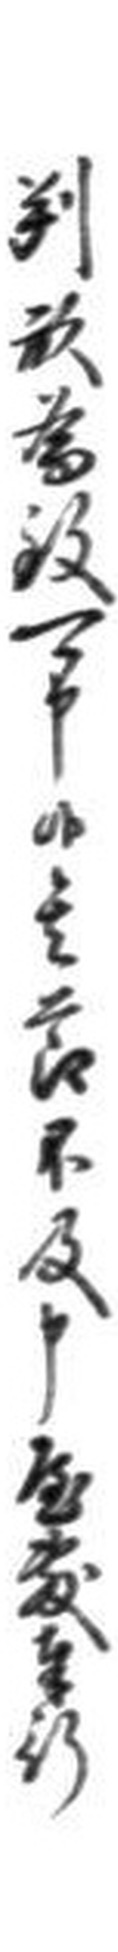判形為致可申候其節不及申屋敷奉行
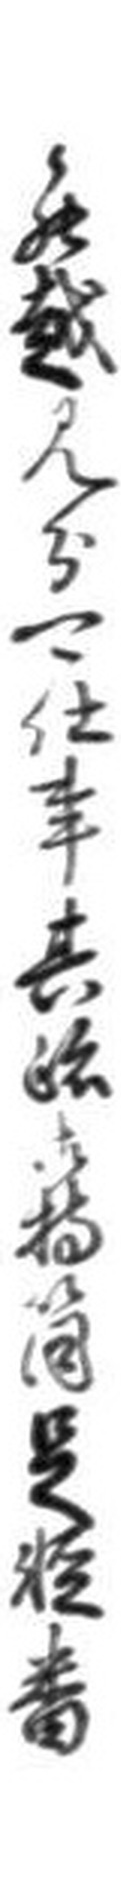罷越見分可仕事其跡御持筒足軽番
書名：家譜 三十二 吉邦公 従享保二年到享保三年
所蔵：福井県文書館 Fukui Prefectural Archives
